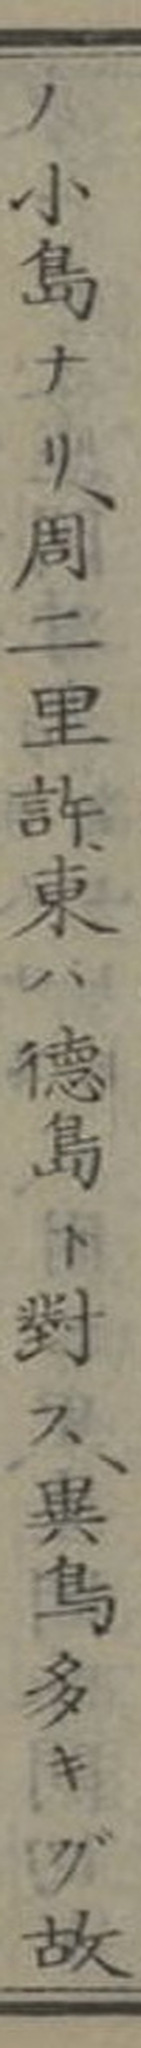ノ小島ナリ、周二里許、東ハ徳島ト対ス、異鳥多キガ故
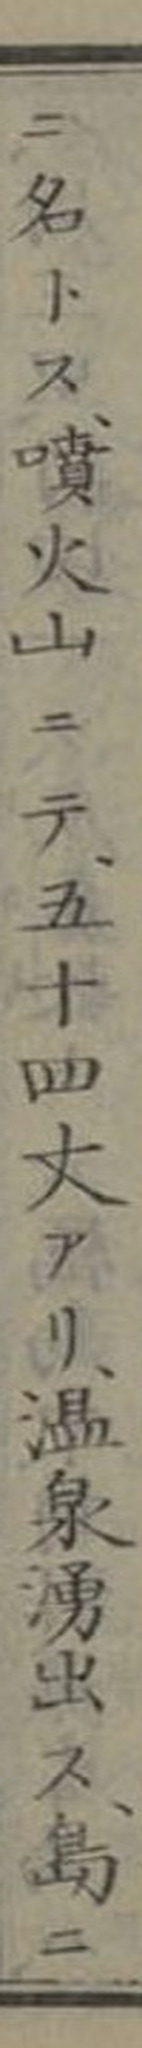ニ名トス、噴火山ニテ、五十四丈アリ、温泉湧出ス、島ニ
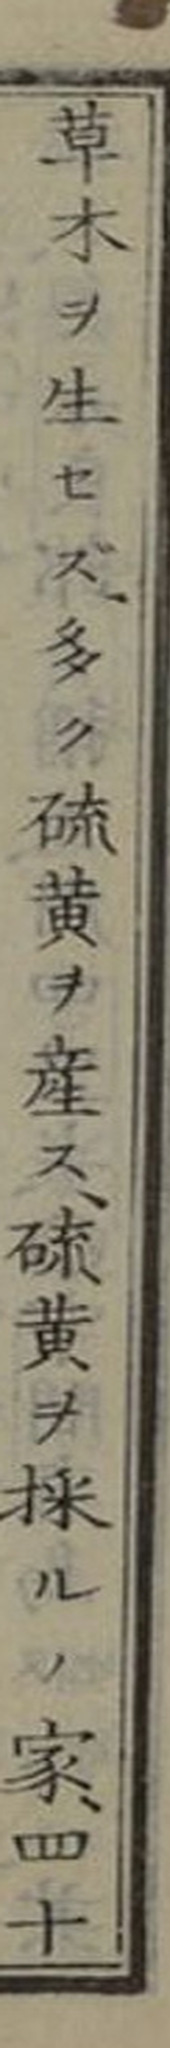草木ヲ生セズ、多ク硫黄ヲ産ス、硫黄ヲ採ルノ家、四十
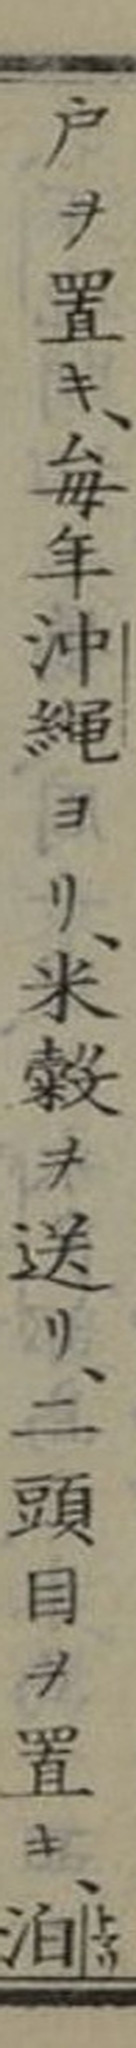戸ヲ置キ、毎年沖縄ヨリ、米穀ヲ送リ、二頭目ヲ置キ、泊
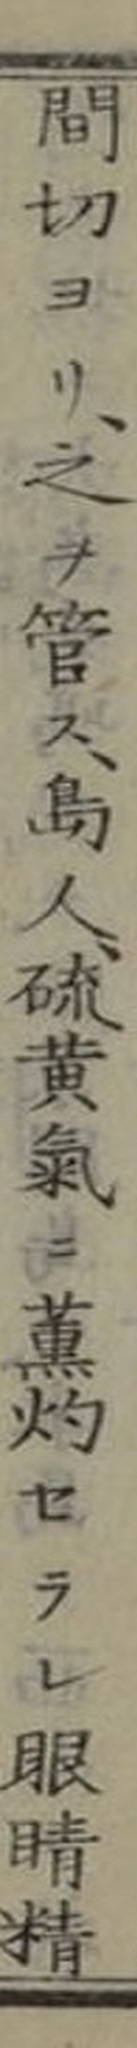間切ヨリ、之ヲ管ス、島人、硫黄気ニ薫灼セラレ眼晴精
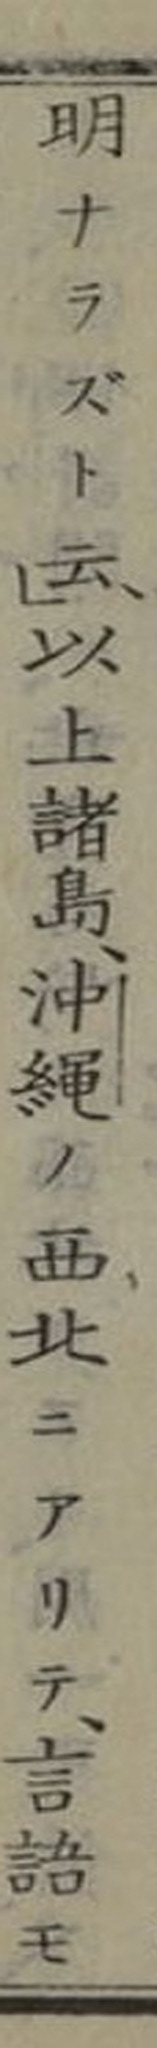明ナラズト云、」以上諸島、沖縄ノ西北ニアリテ、言語モ
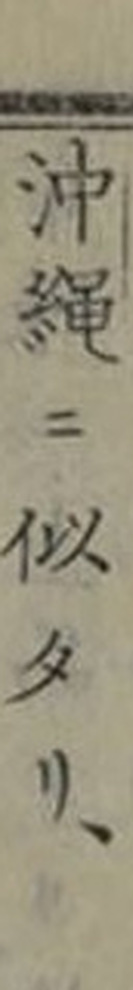沖縄ニ似タリ、
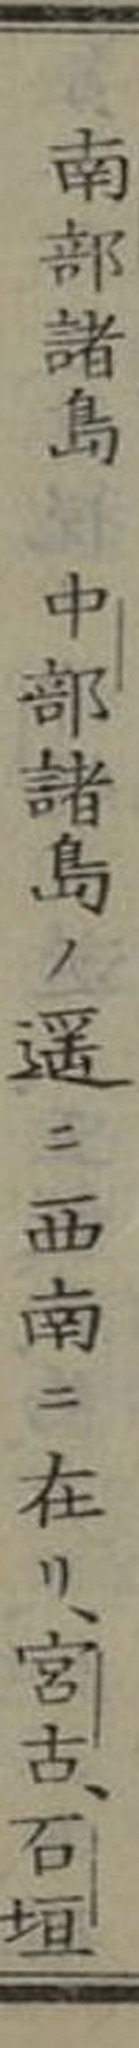南部諸島中部諸島ノ遥ニ西南ニ在リ、宮古、石垣
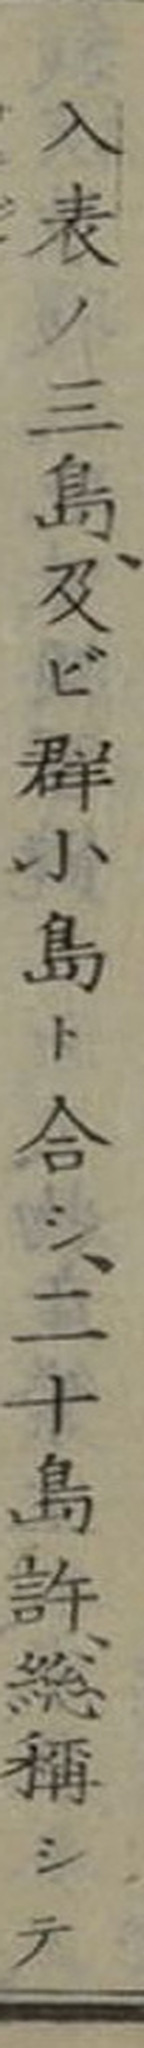入表ノ三島、及ビ群小島ト合シ、二十島許、総称シテ
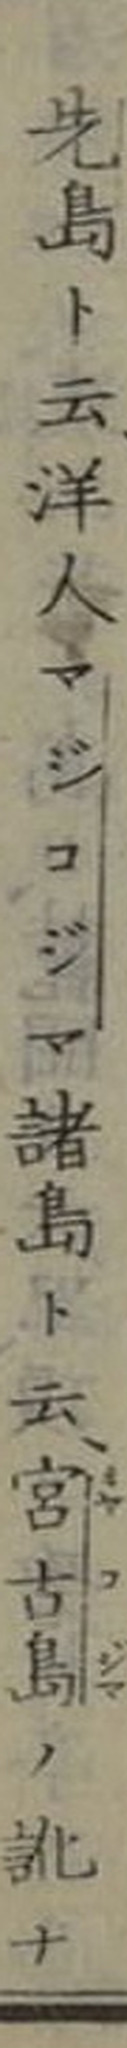先島ト云、洋人マジコジマ諸島ト云、宮古島ノ訛ナ
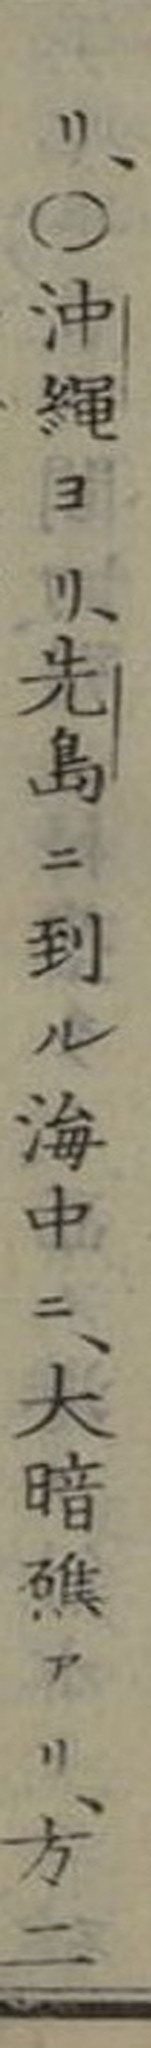リ、○沖縄ヨリ、先島ニ到ル海中ニ、大暗礁アリ、方二
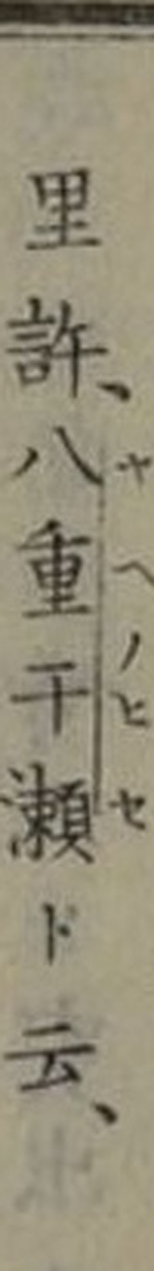里許、八重干瀬ト云、
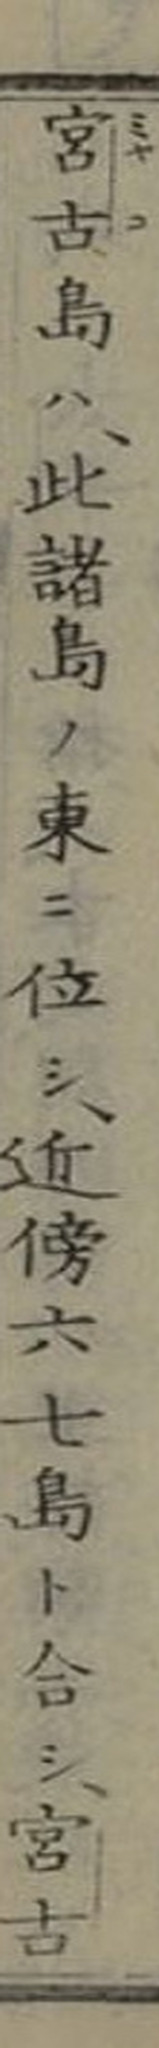宮古島ハ、此諸島ノ東ニ位シ、近傍六七島ト合シ、宮古

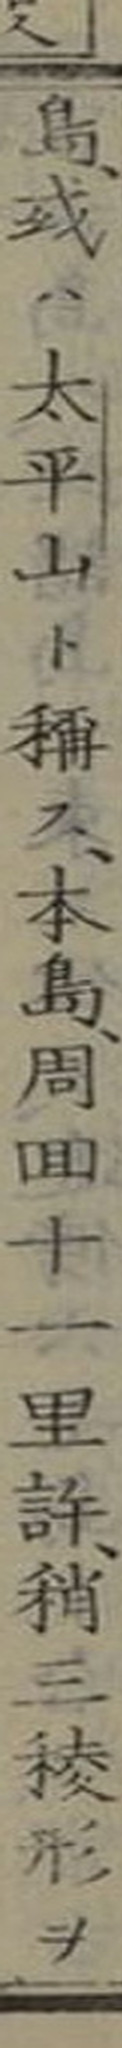島、或ハ太平山ト称ス、本島、周回十一里許、稍三稜形ヲ
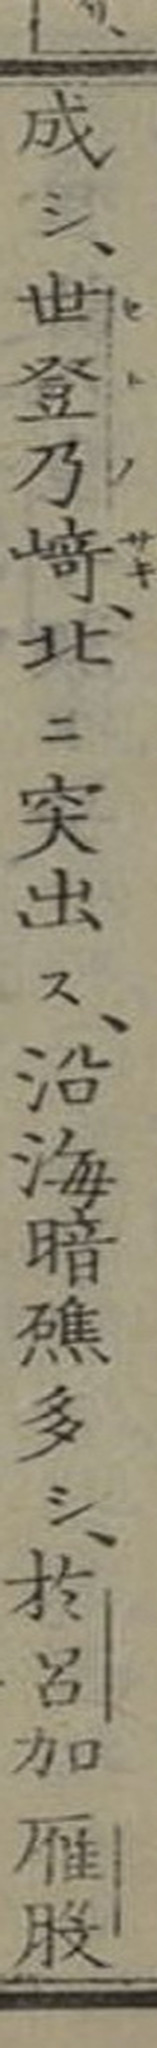成シ、世登乃崎、北ニ突出ス、沿海暗礁多シ、於呂加雁股
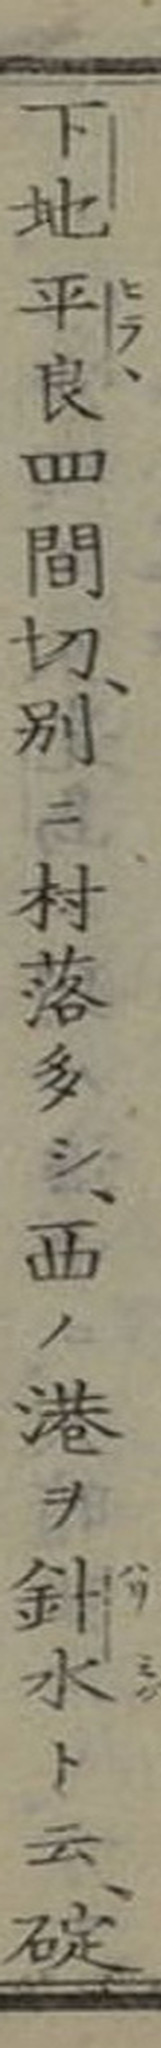下地平良四間切、別ニ村落多シ、西ノ港ヲ針水ト云、碇
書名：琉球新誌 図附 上
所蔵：University of the Ryukyus Library
